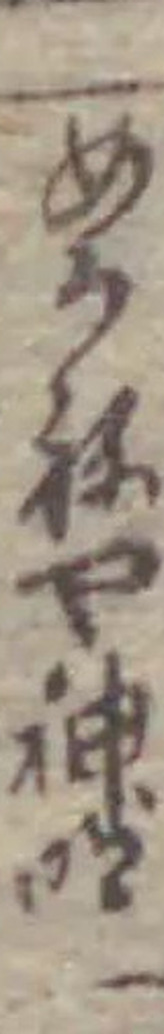めかねや神明
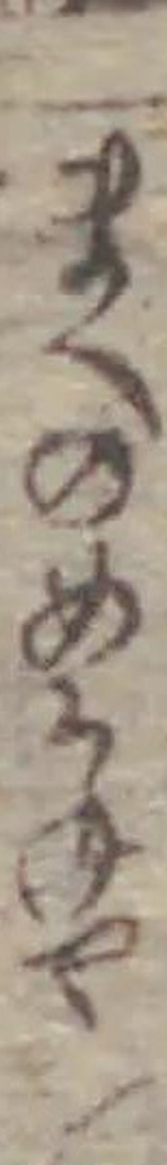まへのめかねや
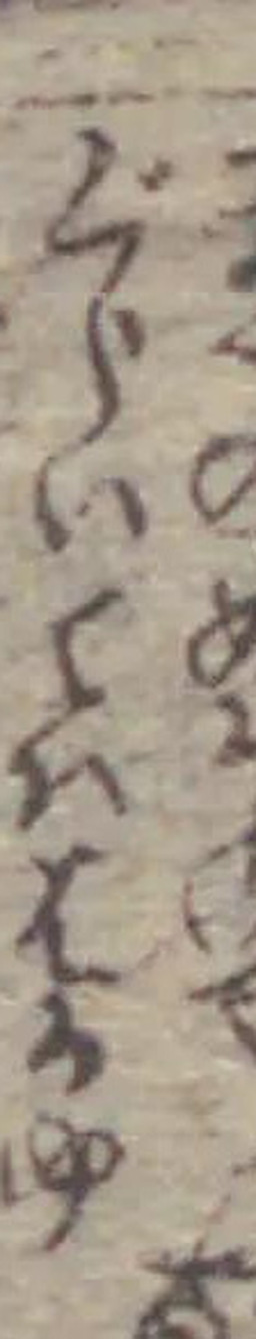ぐらいてははかゆ
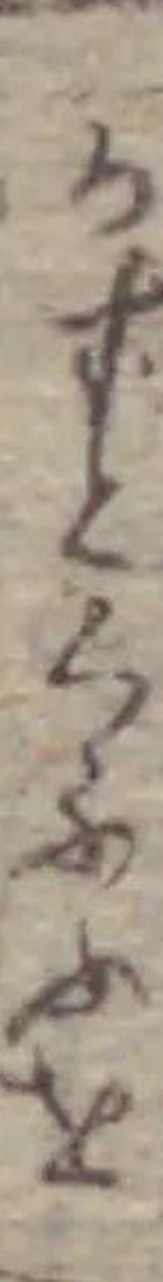かずとくふふを
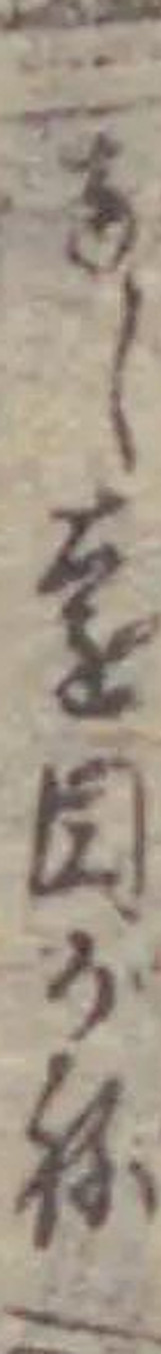なし遠目かね
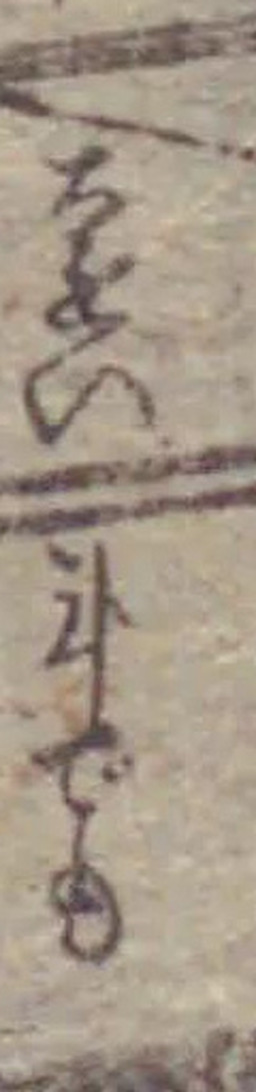遠い計でも
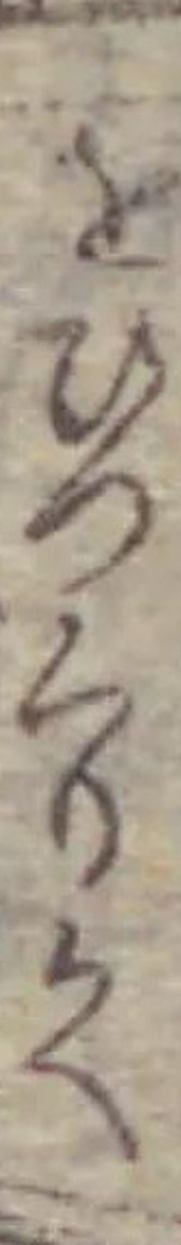をひつくりかへ
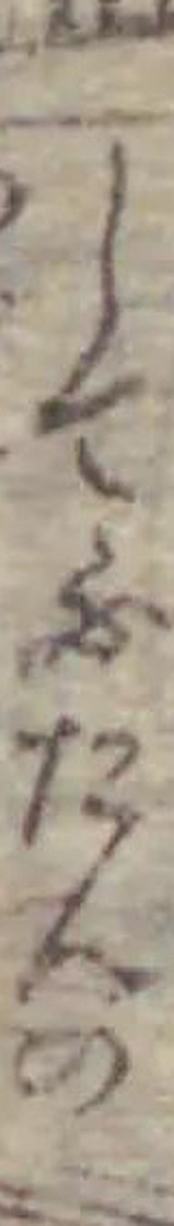してふたんの
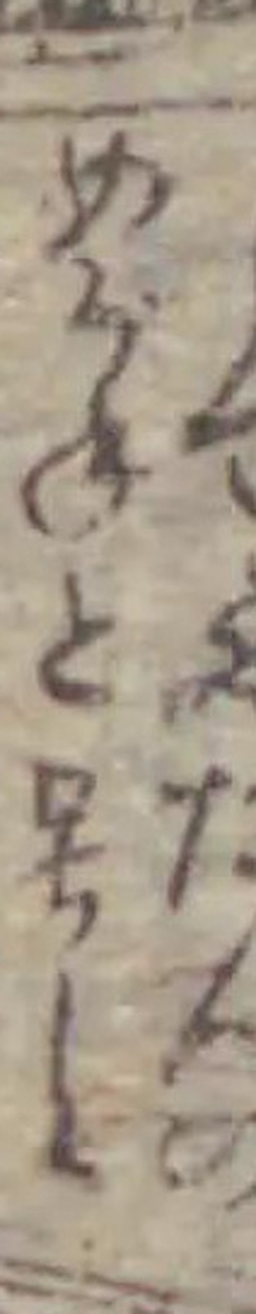めがねと号し
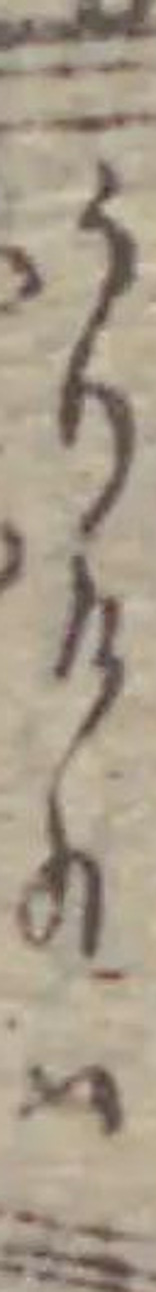うりけれは
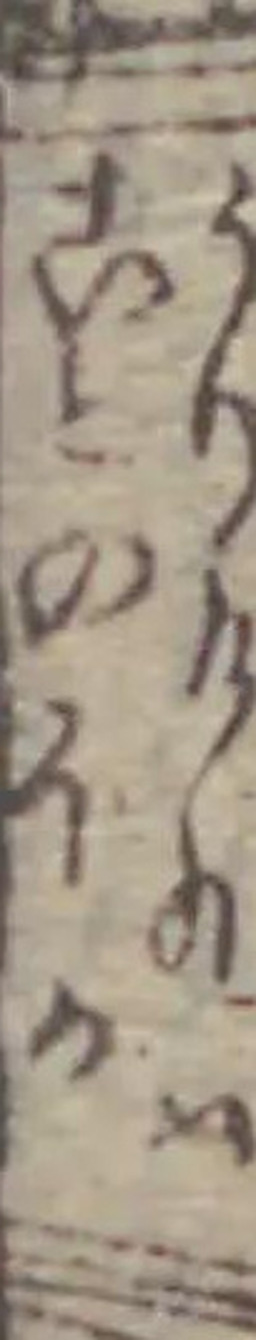ことのほか
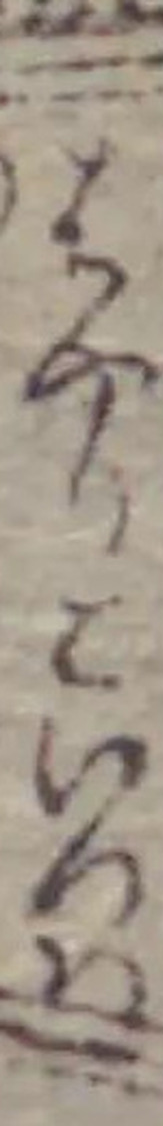はやりこいつは
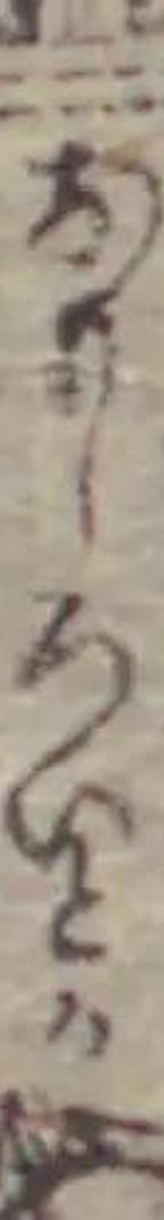おもしろいとか
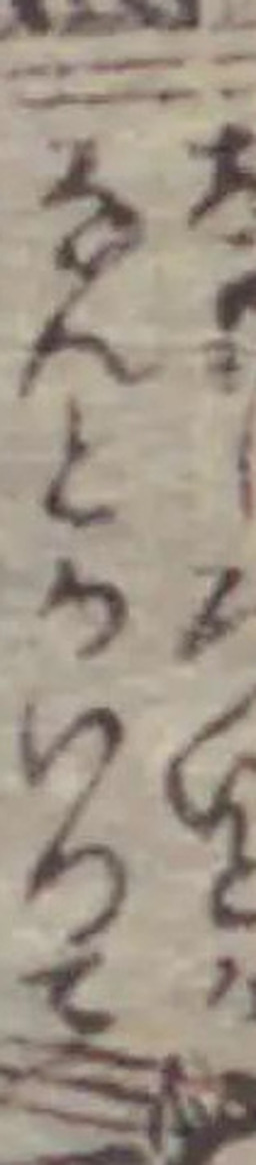なんとかいつて
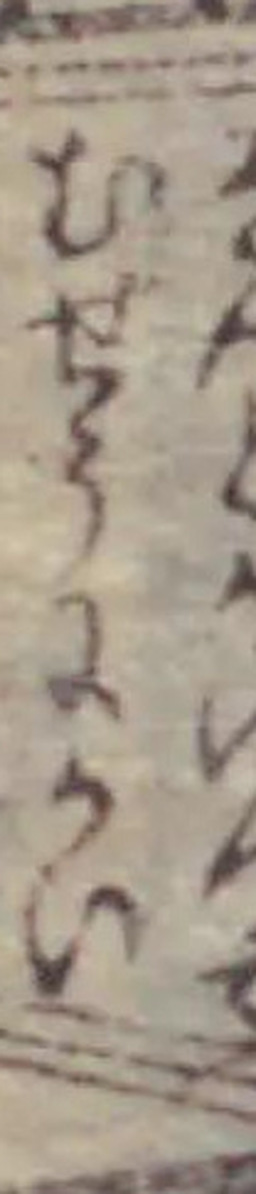むせうにかい
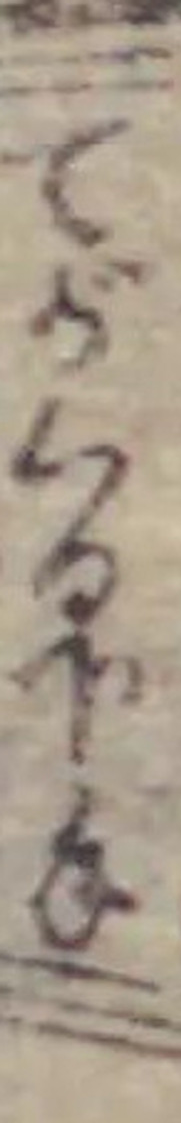てがくる下手
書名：栄増眼鏡徳 3巻
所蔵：国立国会図書館 National Diet Library, JAPAN
